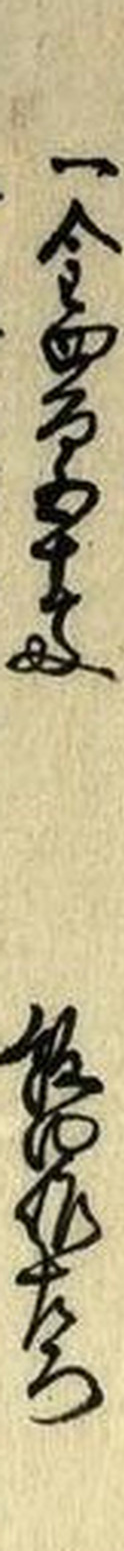一金四百五十両飯田作左衛門
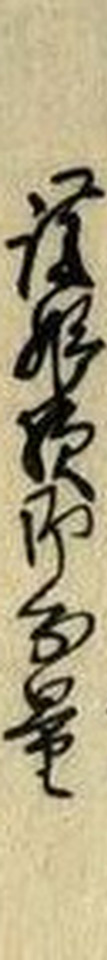謹姫様御分量
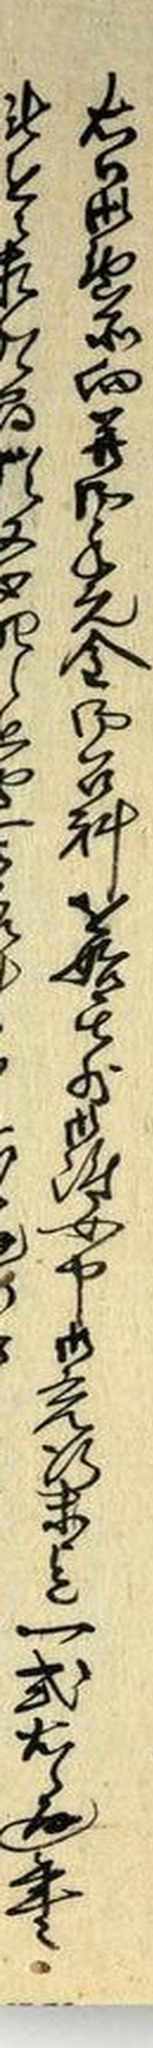右ハ御台所向并御手元金御召料を始其外御附女中御充行等迄一式右之通年々
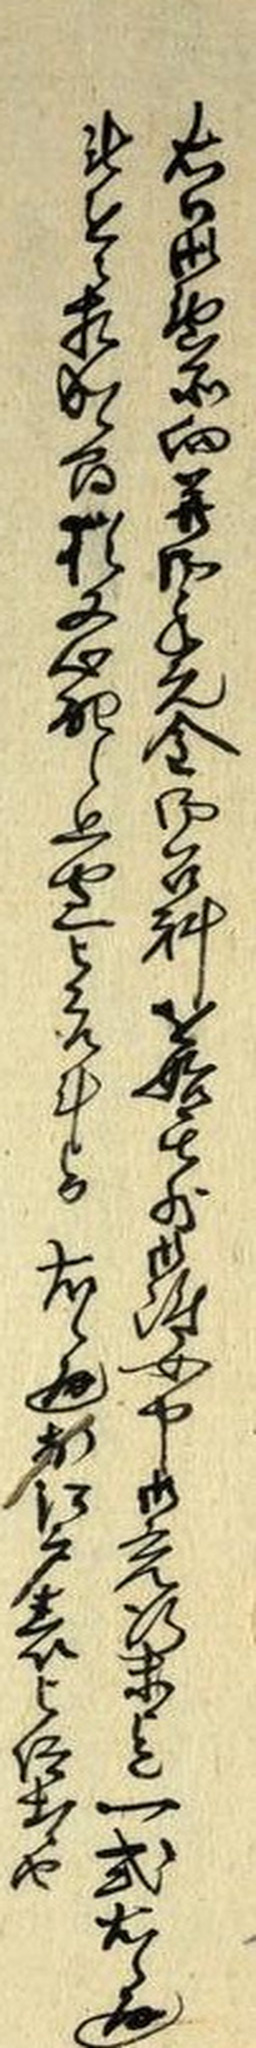被進ニ相成候間猶又心配之上宣被取斗旨右之通於江戸表被仰出候由
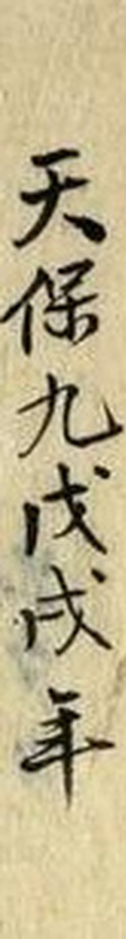天保九戊戌年
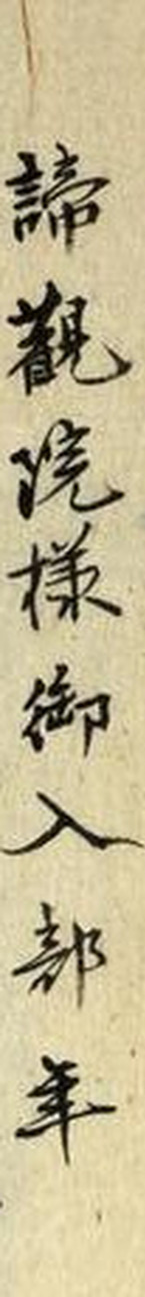諦觀院様御入部年
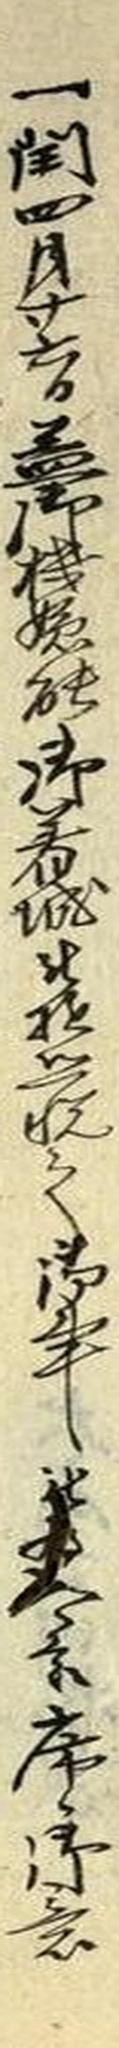一閏四月廿六日益御機嫌能御着城被遊恐悦之御事被為入候節席へ御意
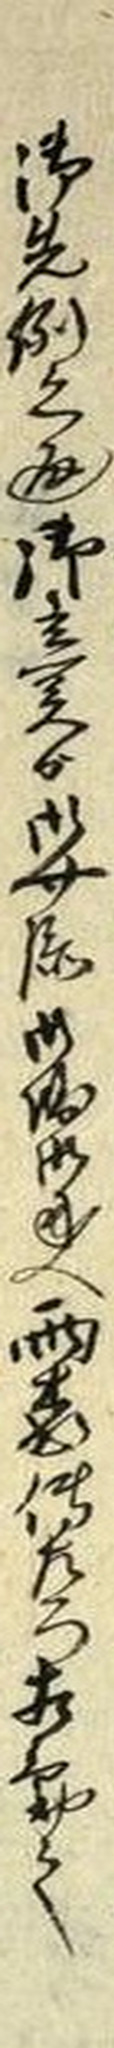御先例之通御玄関ゟ御介添御側御用人雨森伝左衛門相勤之
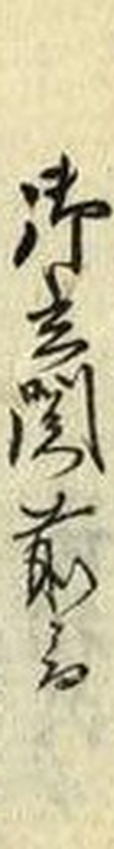御玄関前ニ而
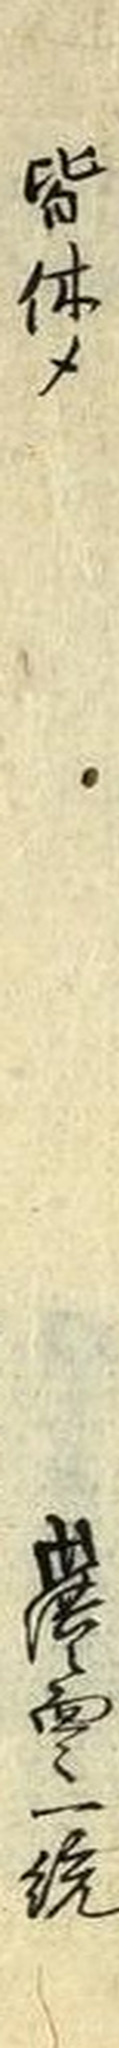皆休メ御供面々一統
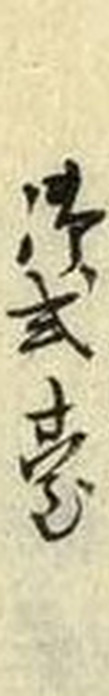御式台
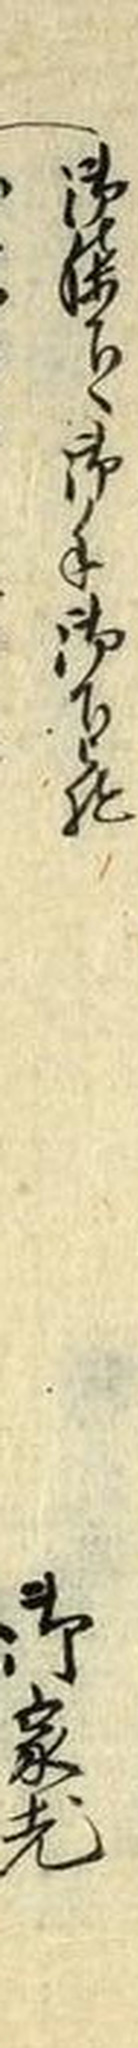御膝下へ御手御下被遊御家老
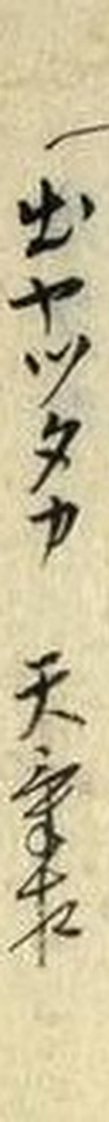出ヤツタカ天気相
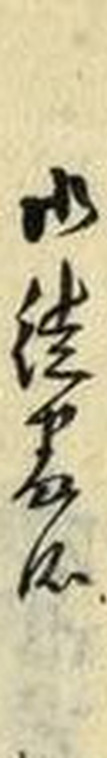御徒番所
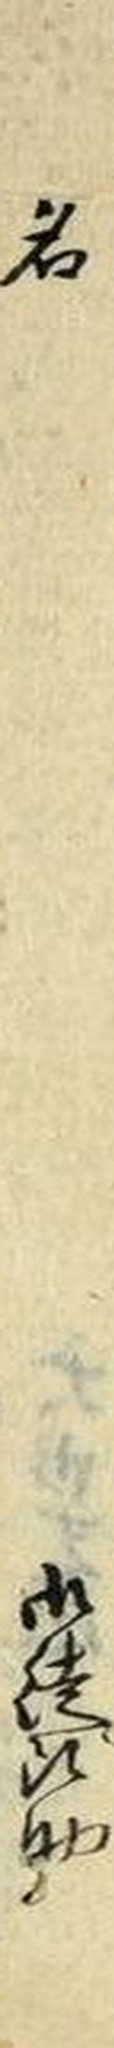名御徒頭助

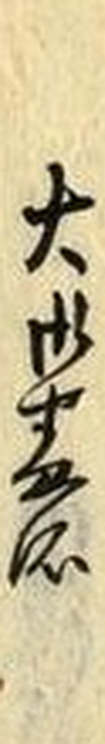大御番所
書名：少傅日録抄（斉善付側向頭取日記、江戸并道中、初入在国、逝去後…
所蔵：福井県文書館 Fukui Prefectural Archives
